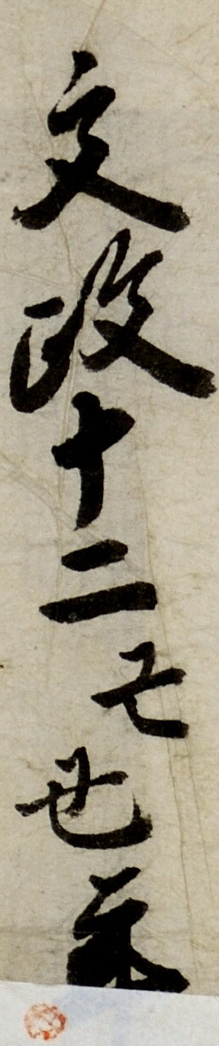文政十二己丑年
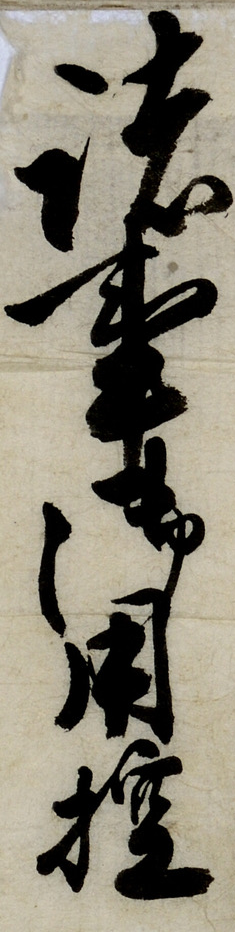諸事御用控
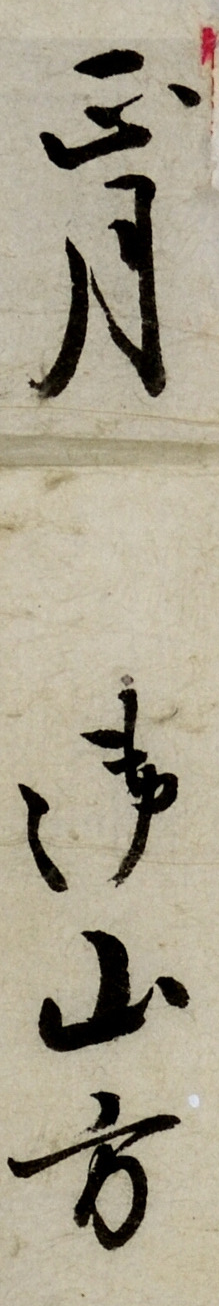正月御山方
